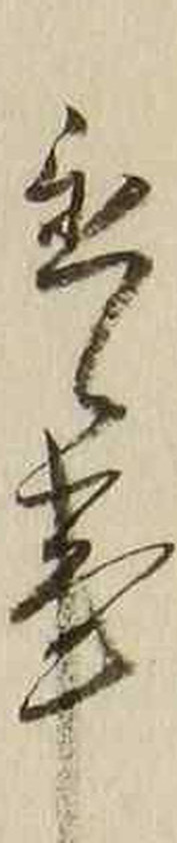置候事
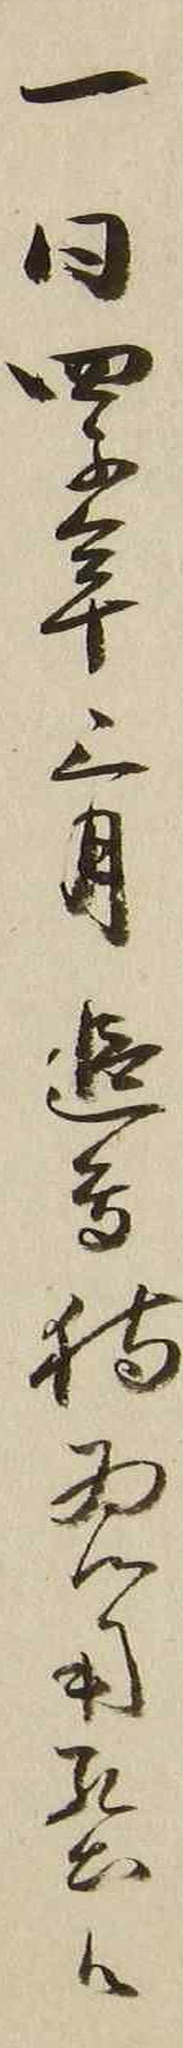一同四子年三月追鳥狩為御用罷出候
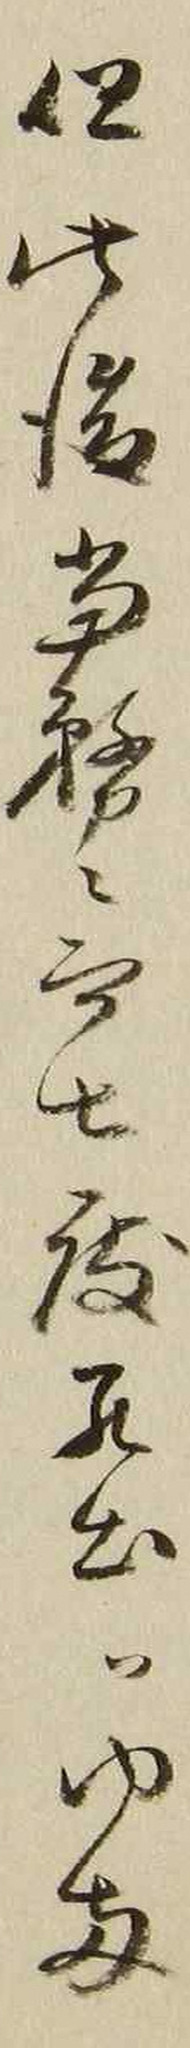但此後当務ニ而七度罷出候内両
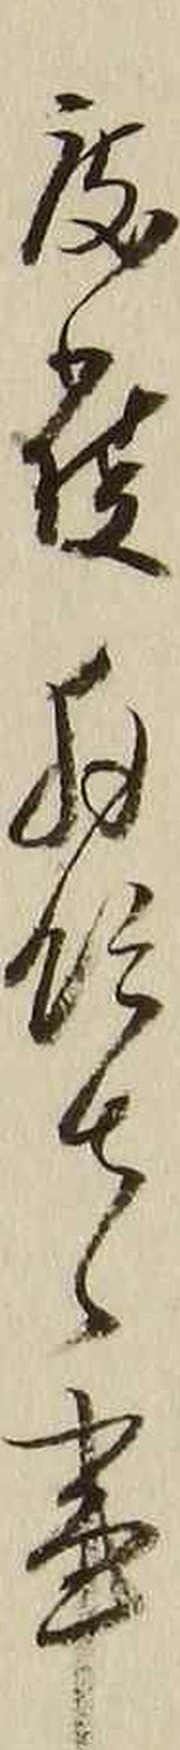度獲拝領仕候事
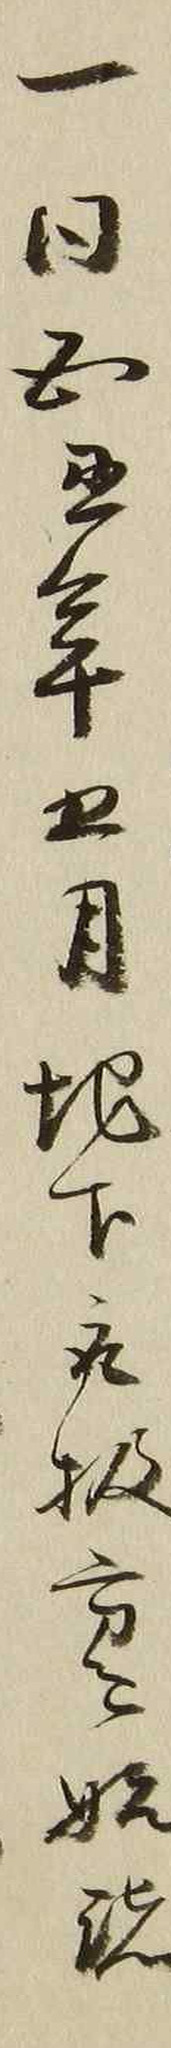一同五丑年五月地下取扱方を始諸
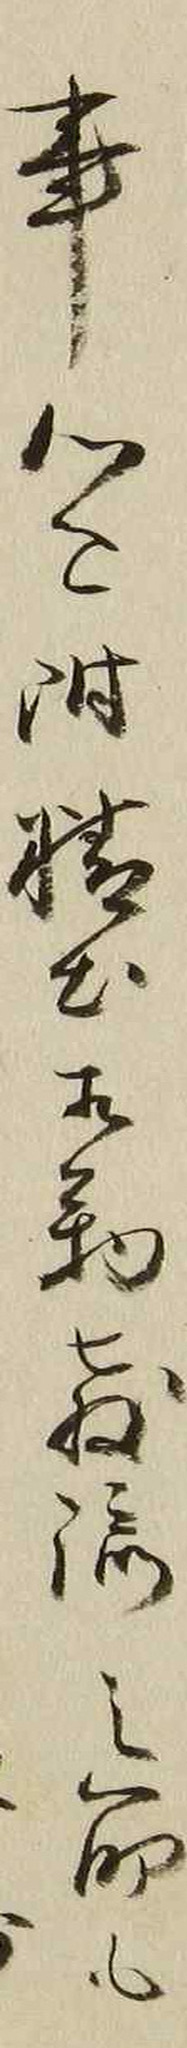事心を附精出相勤教諭之筋も
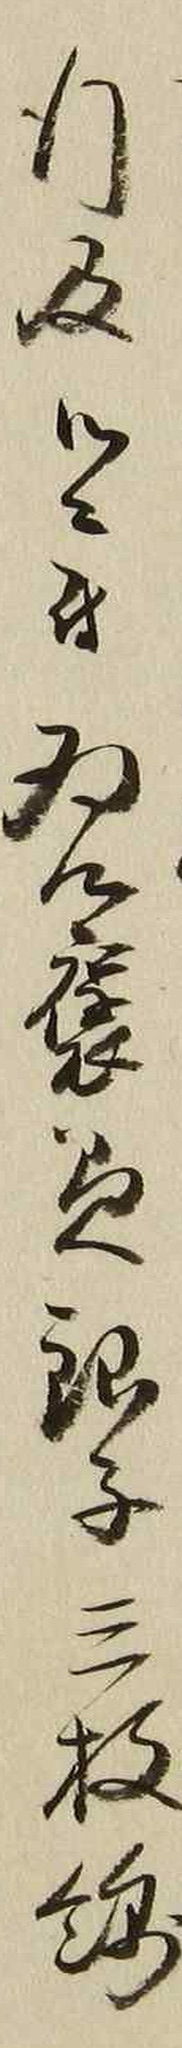行及候ニ付為御褒美銀子三枚綿
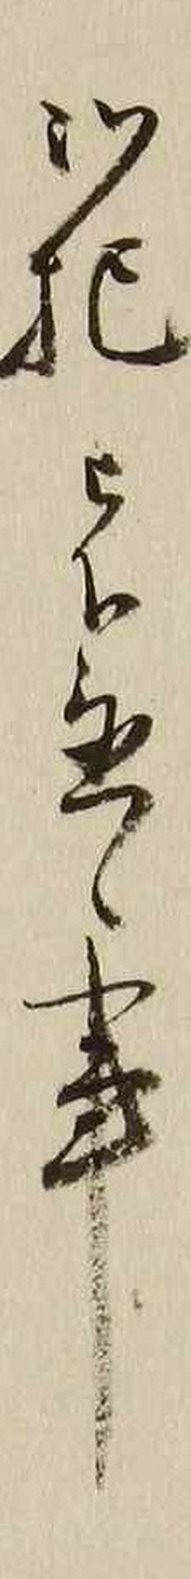弐把被下置候事
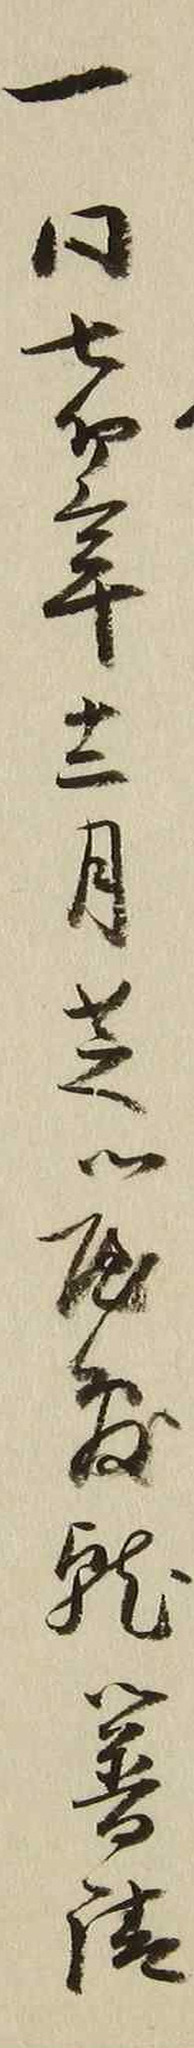一同七卯年十二月芝御屋敷就御普請
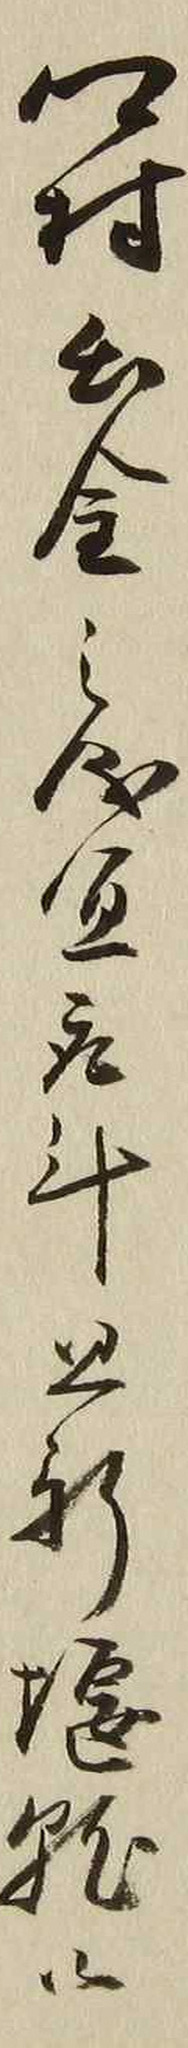郷村出金之儀宜取計且新堰就御
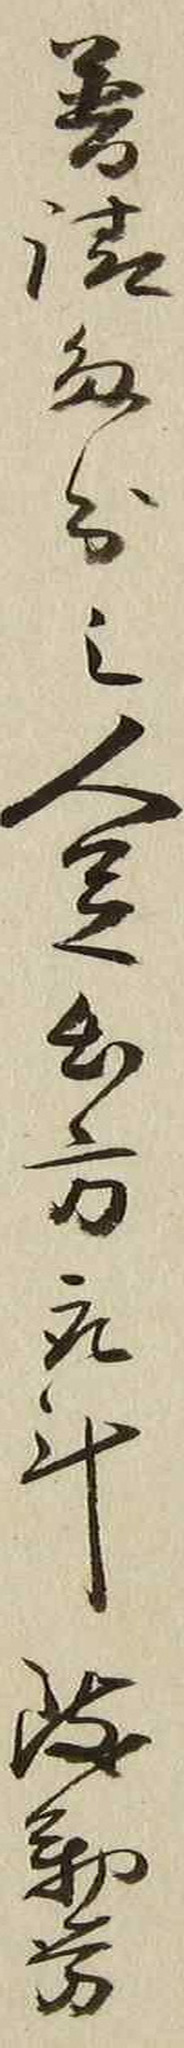普請多分之人足出方取計致勤労
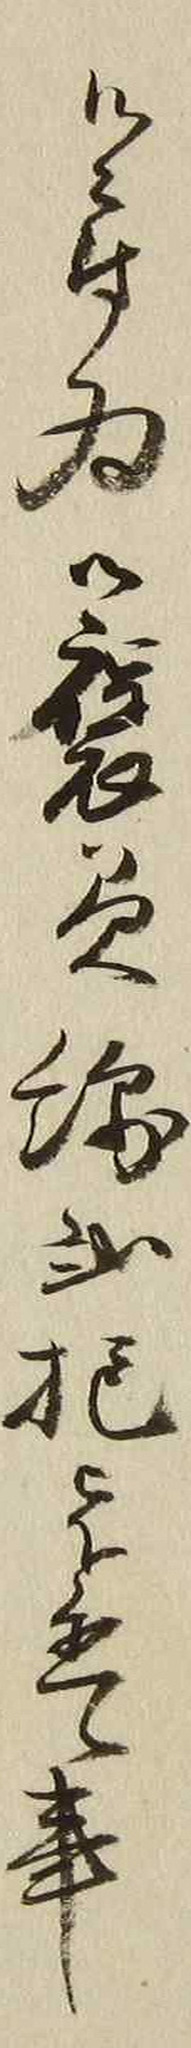候ニ付為御褒美綿弐把被下置候事
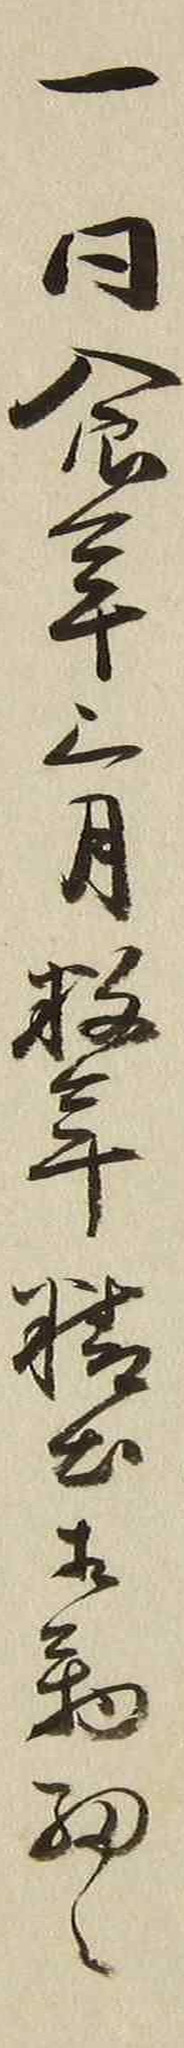一同八辰年三月数年精出相勤細之
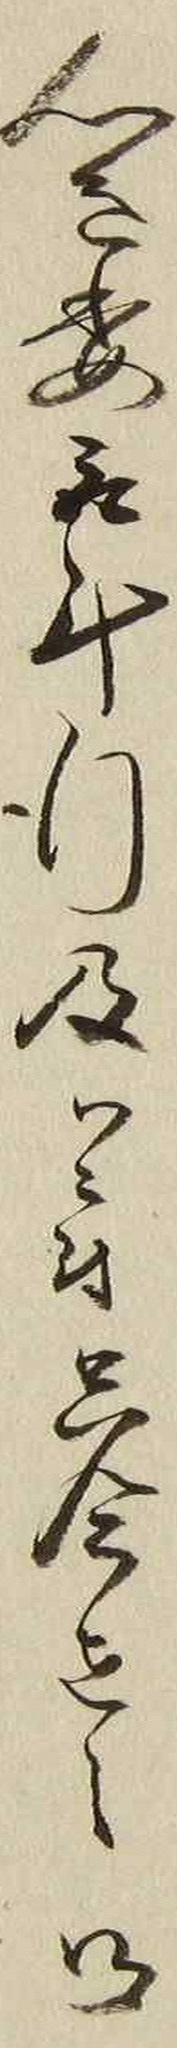心を委取計行及候ニ付只今迄之御
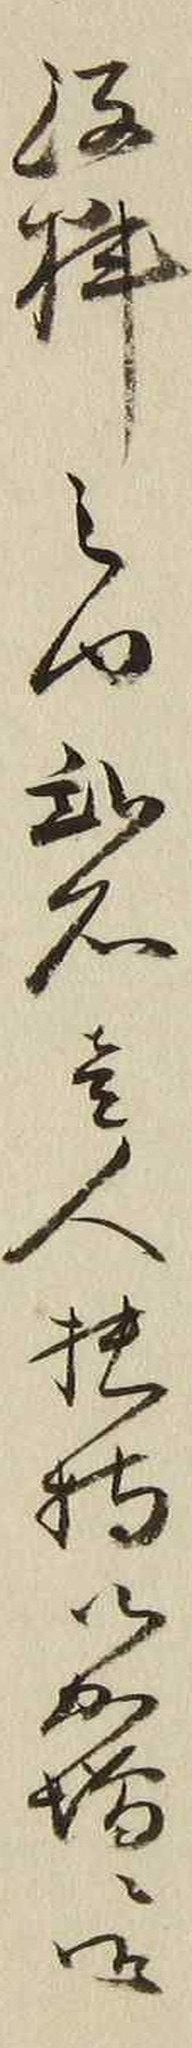役料之内弐石壱人扶持御加増ニ御
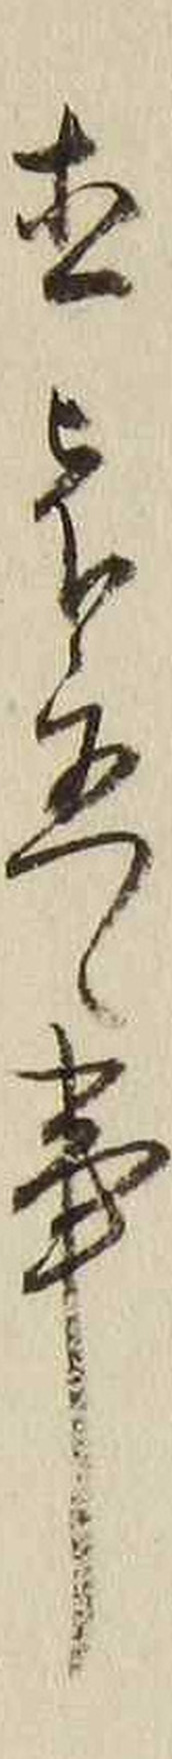直被下置候事
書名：諸士系譜　巻之288　さ之部20
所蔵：会津若松市立会津図書館
